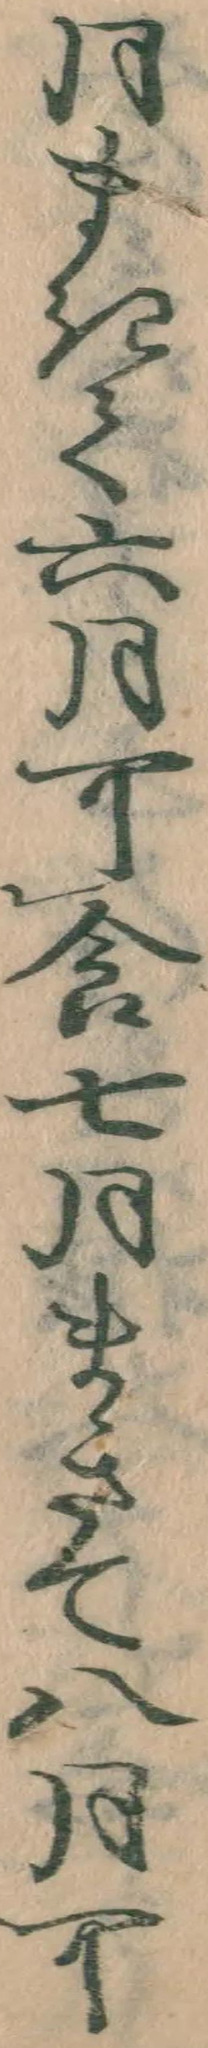月まきて六月可食七月まきて八月可
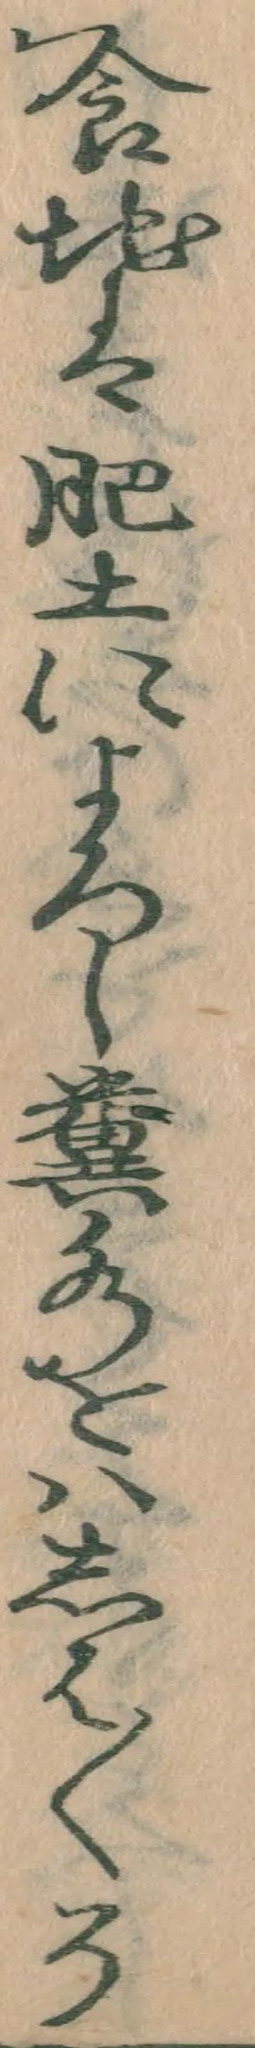食地は肥土によろし糞水をはしは〳〵そ
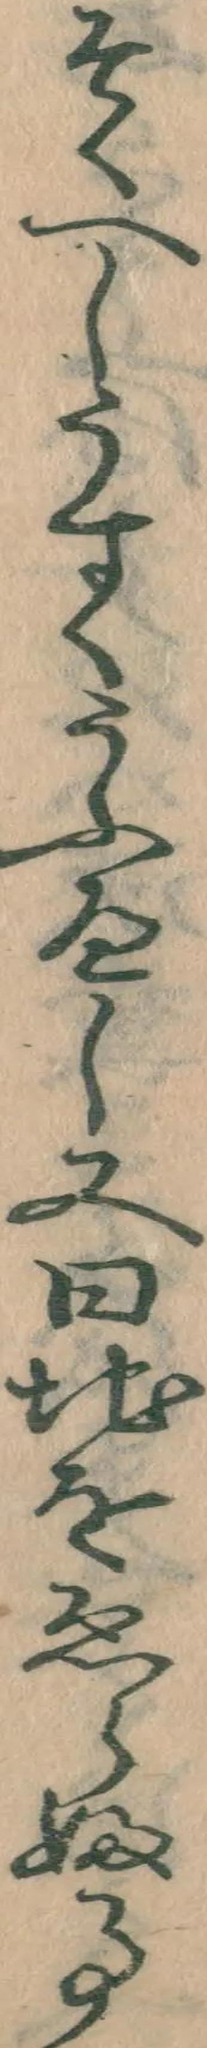そくへしうすくふへし又曰地をゑらふ事
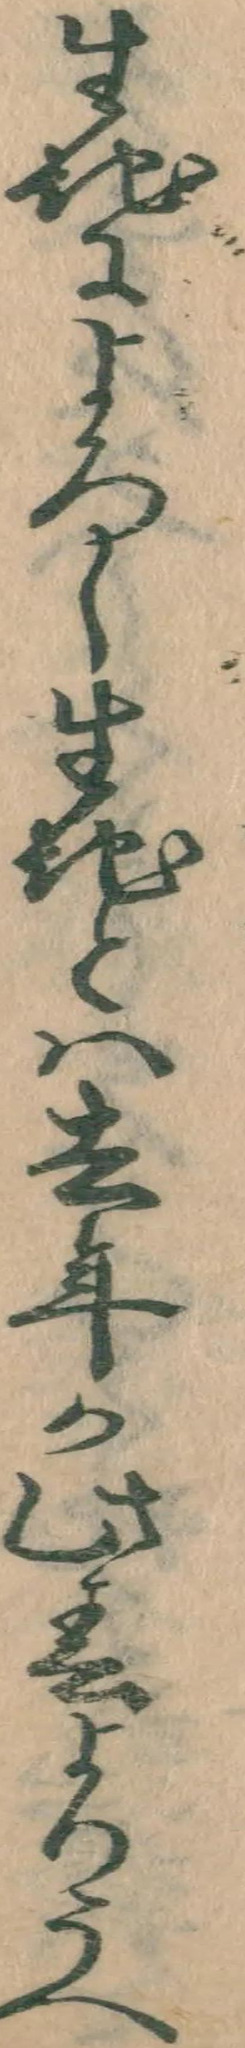生地によろし生地とは去年か此春よりうへ
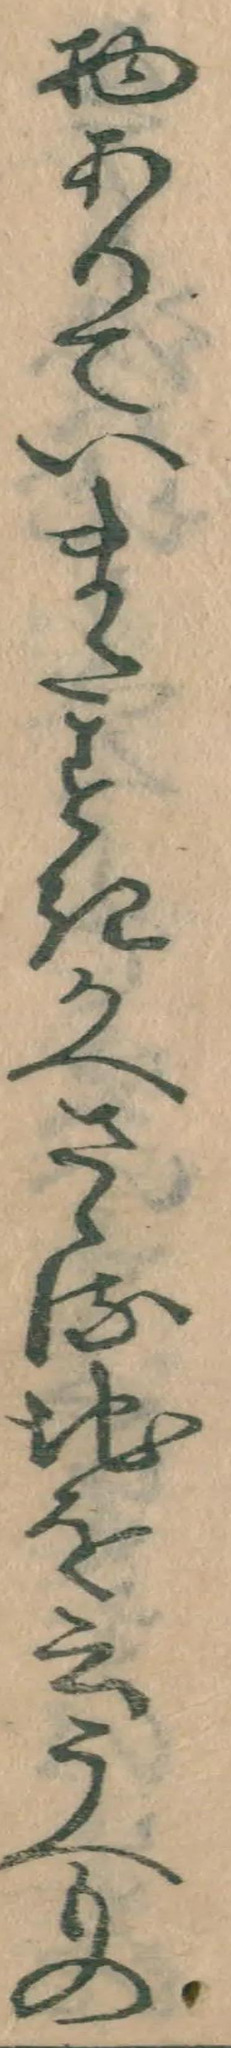物ありていまたすきかへさる地を云うへもの

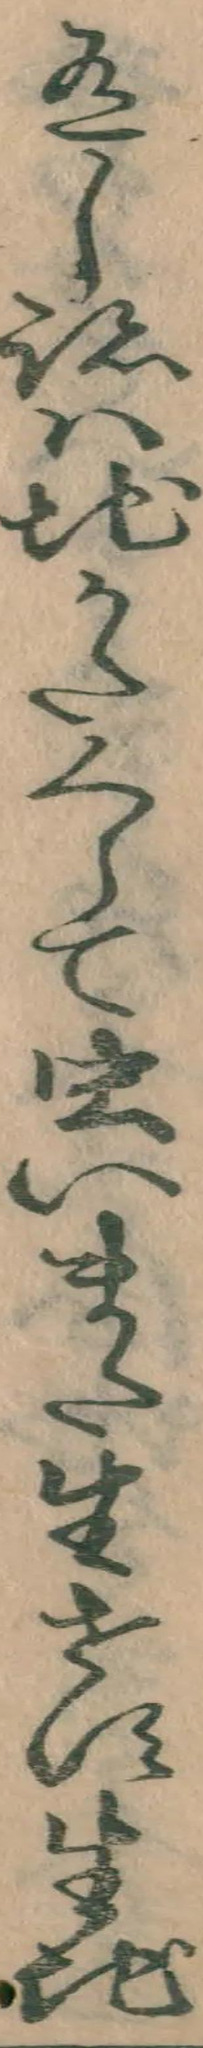有し跡は地かたくして虫いまた生せす生地
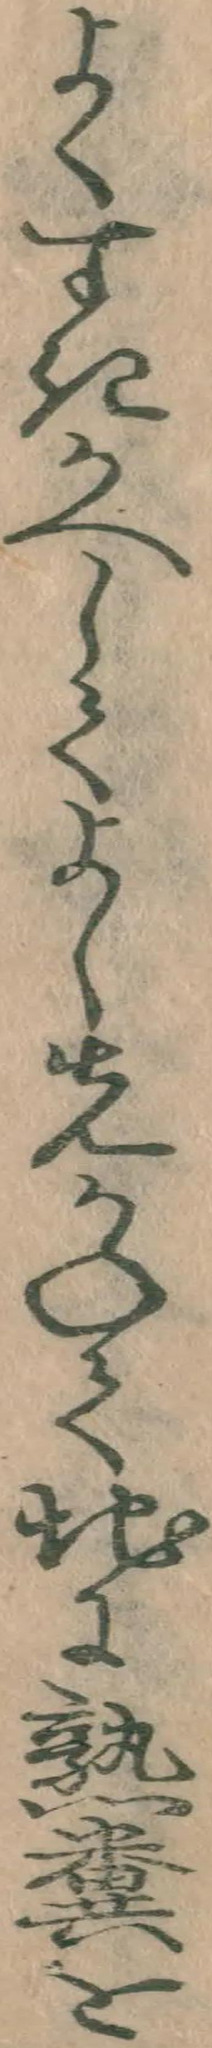よくすきかへしてよし先かねて地に熟糞を
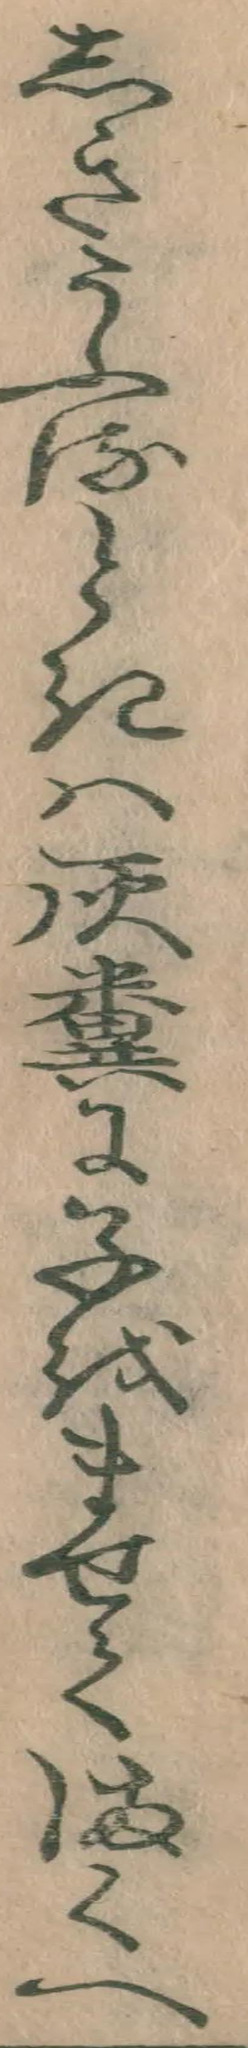しきうふるときは灰糞に子をませてまくへ
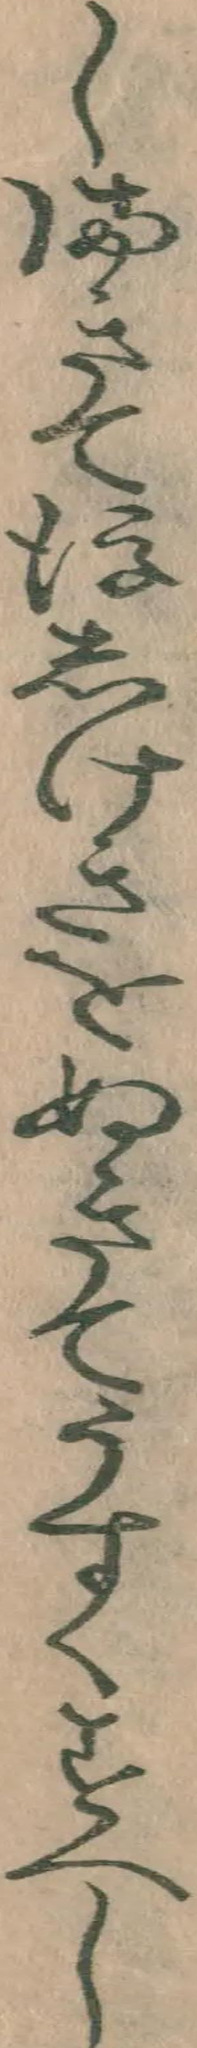しまきて後しけきをぬきてうすくすへし
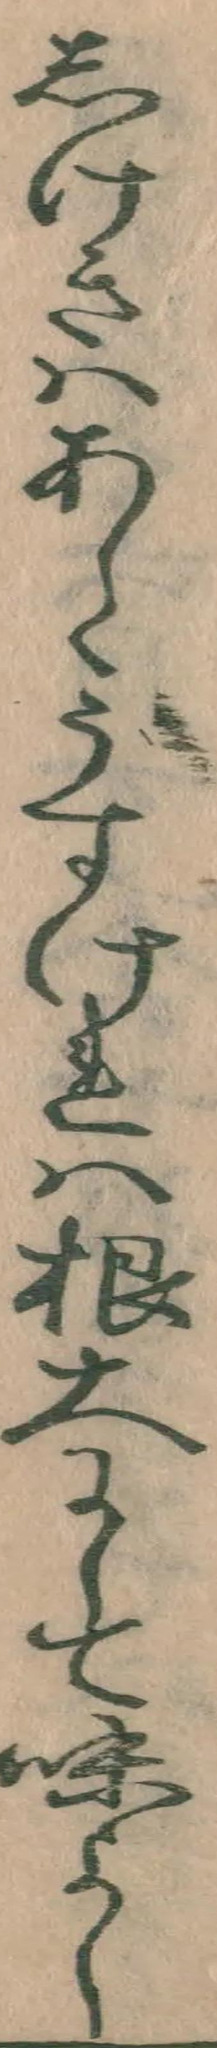しけきはあしゝうすけれは根大にして味よし
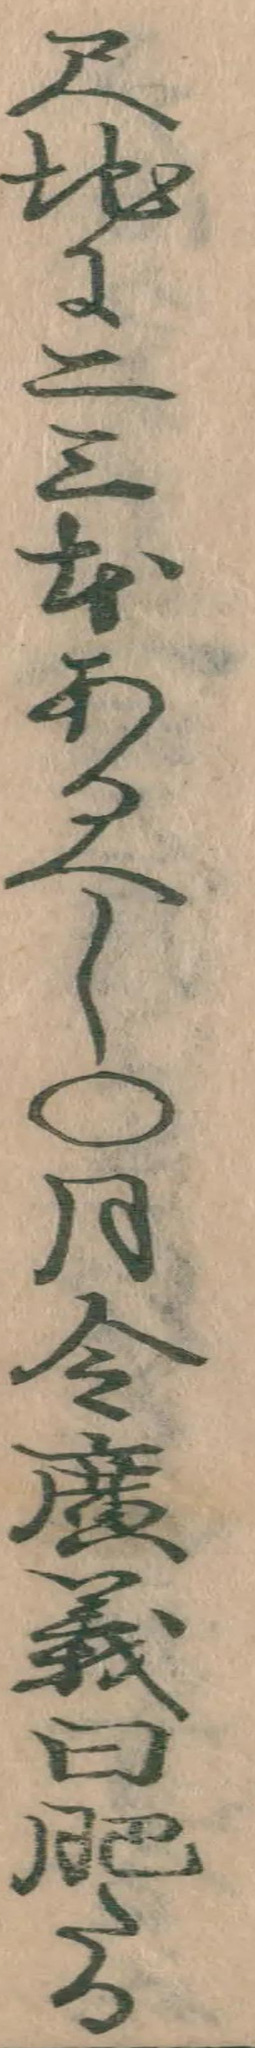尺地に二三本あるへし〇月令広義曰肥たる
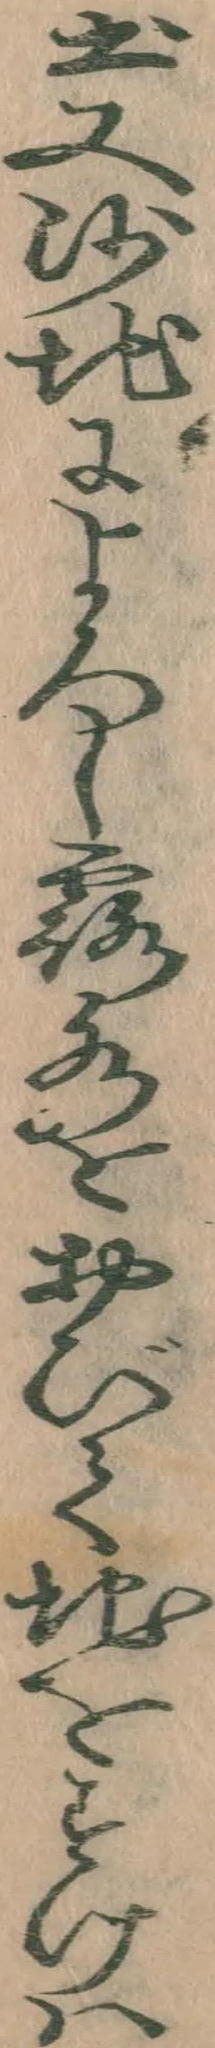土又沙地によろし露水をおびて地をすけは
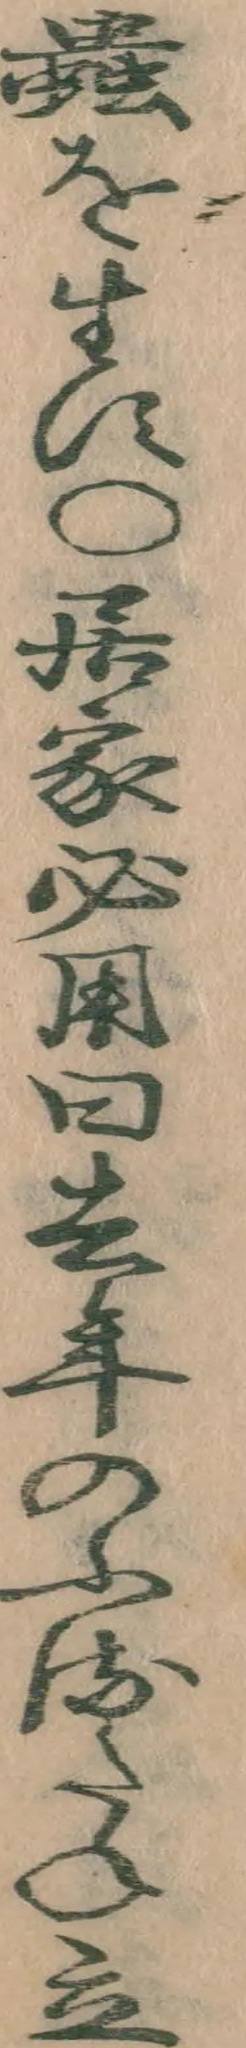虫を生す〇居家必用曰去年のふるたね立
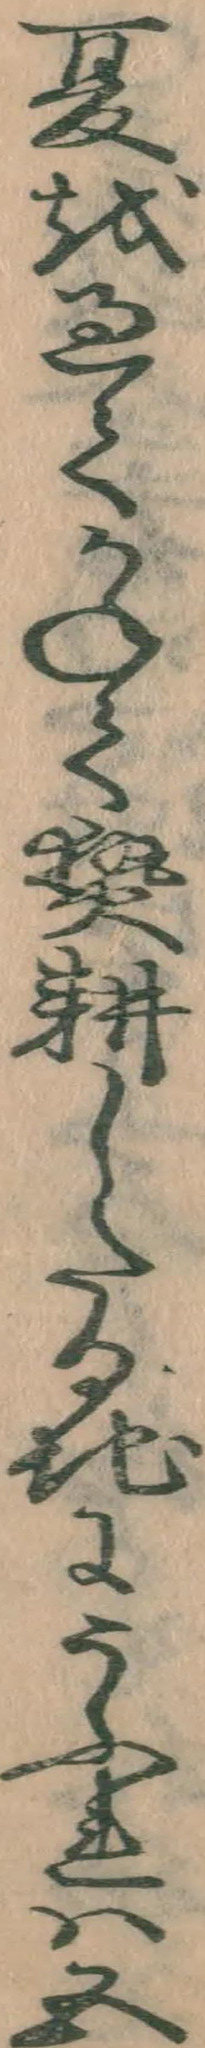夏を過てかねて熟耕したる地にうふれは五
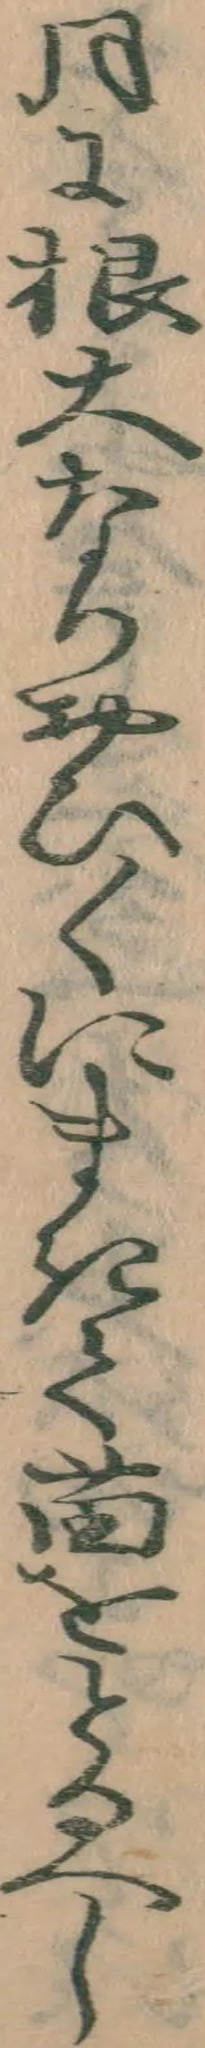月に根大なりおひ〳〵にまきて苗をとるへし
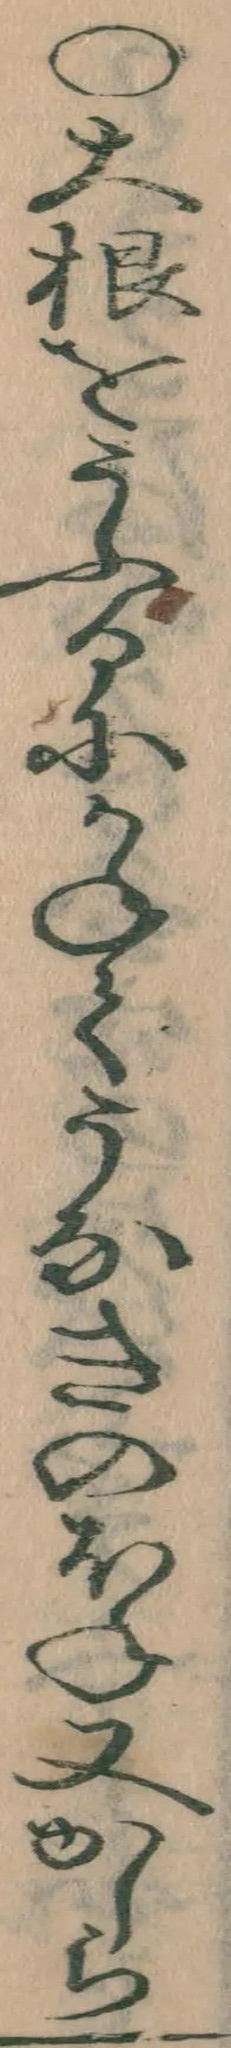〇大根をうふるにかねてうなきのほね又かしら
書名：菜譜 3巻
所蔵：国立国会図書館 National Diet Library, JAPAN
